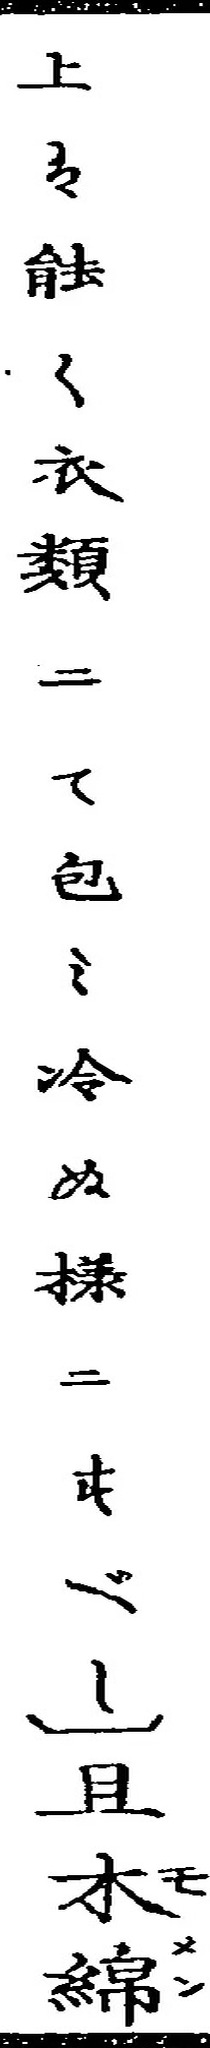上は能く衣類にて包み冷ぬ様にすべし]且木綿
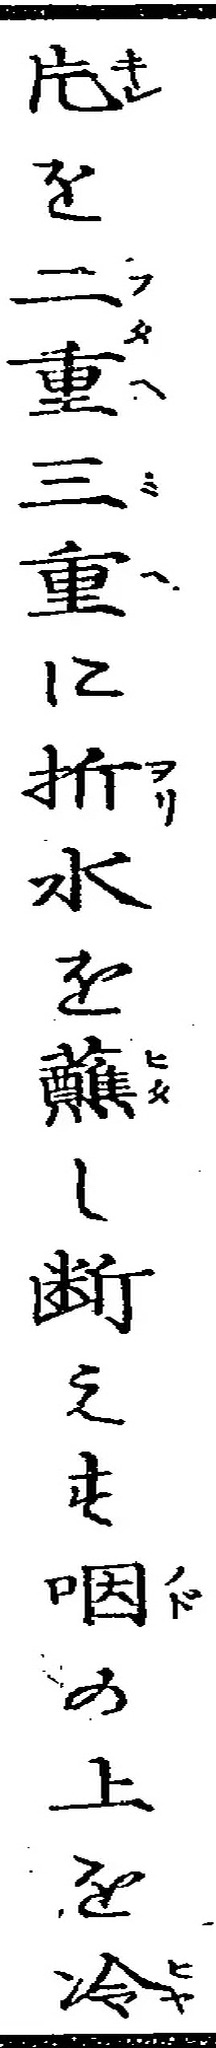片を二重三重に折水を蘸し断えす咽の上を冷
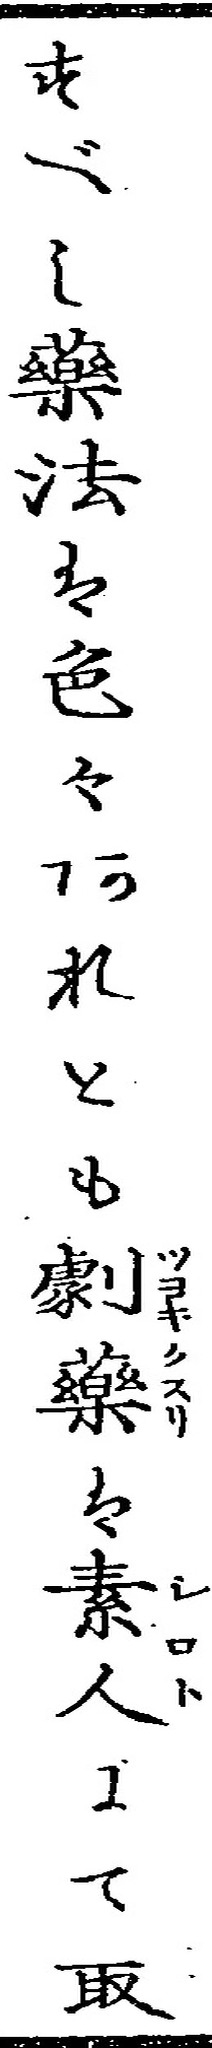すべし薬法は色々あれとも劇薬は素人にて取
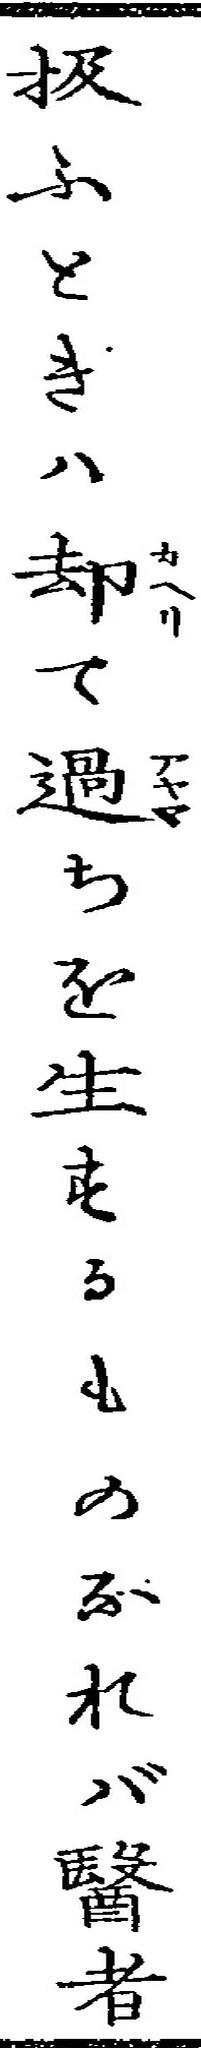扱ふときは却て過ちを生するものなれば医者
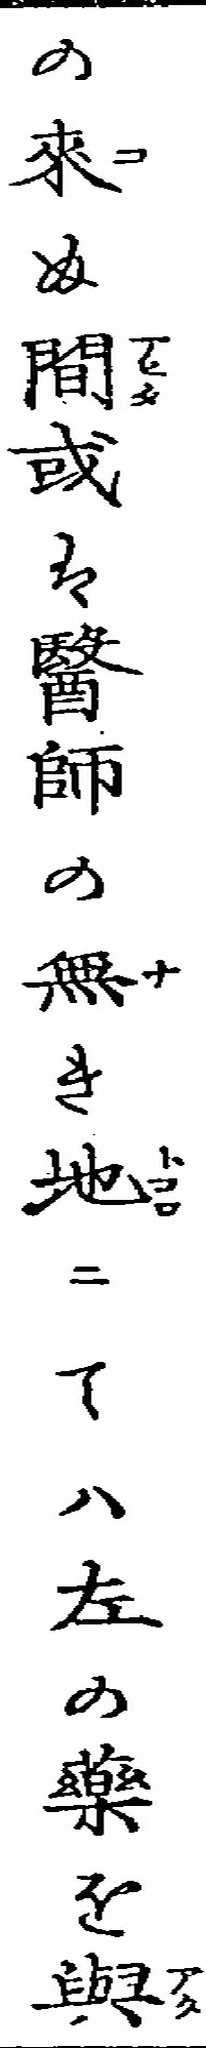の来ぬ間或は医師の無き地にては左の薬を与
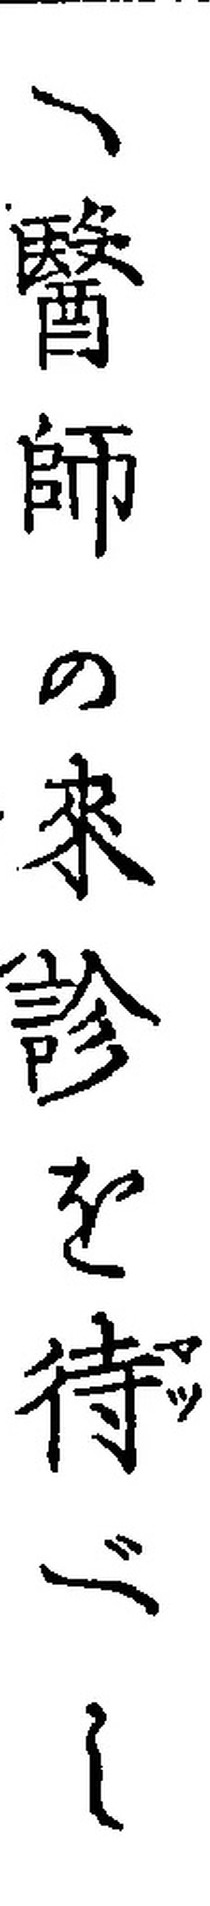へ医師の来診を待べし

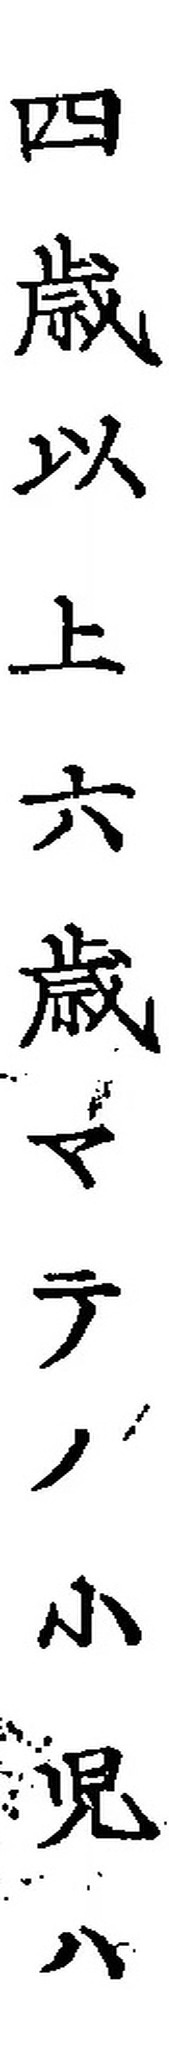四歳以上六歳マテノ小児ハ
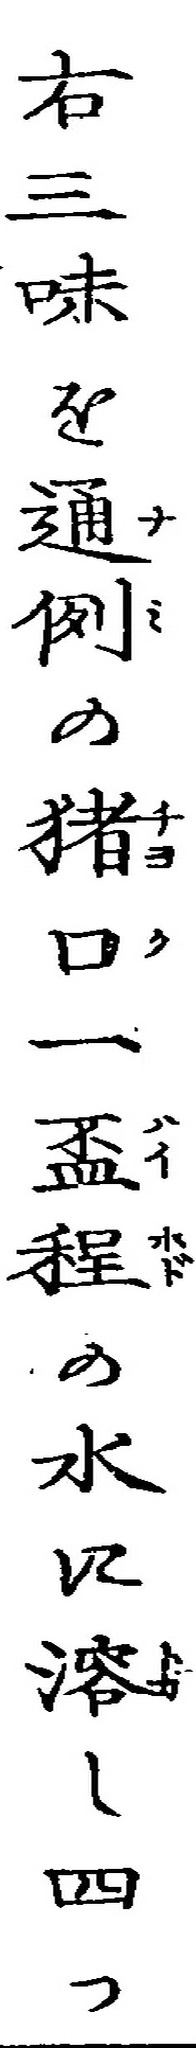右三味を通例の猪口一盃程の水に溶し四つ
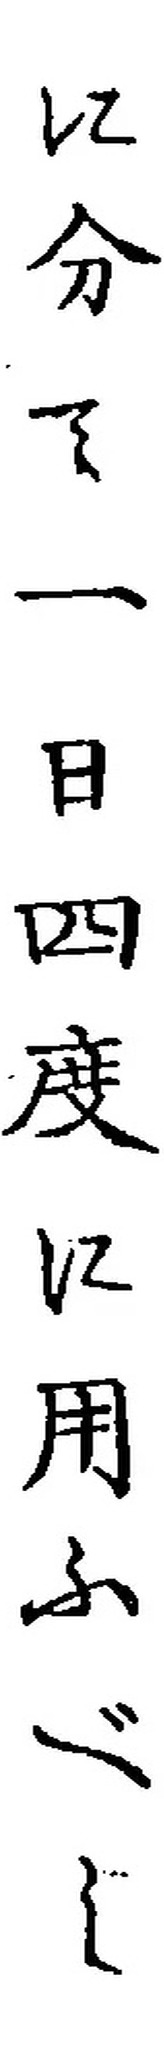に分て一日四度に用ふべし
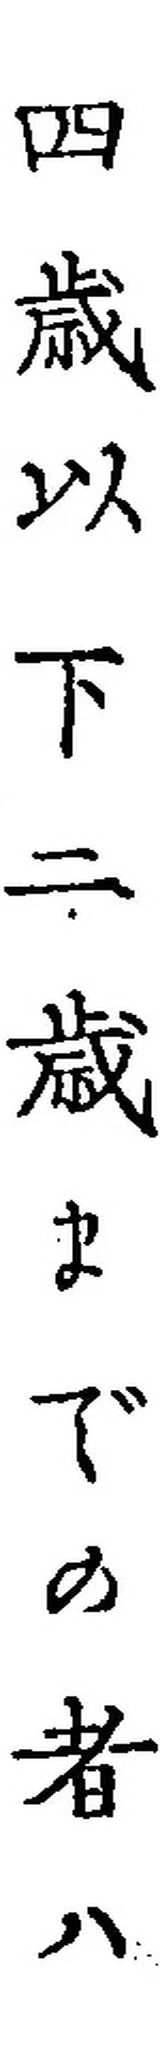四歳以下二歳までの者は
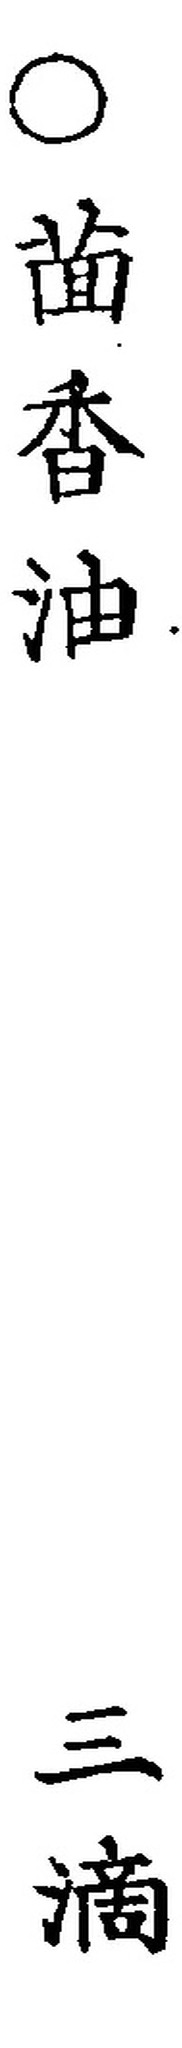○茴香油三滴
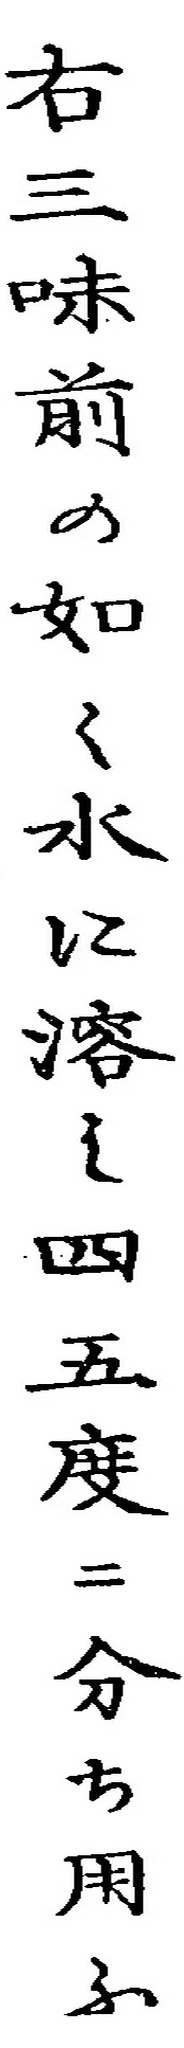右三味前の如く水に溶し四五度に分ち用ふ
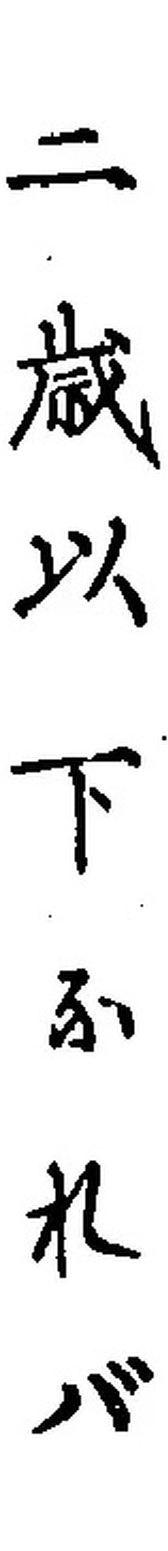二歳以下なれば
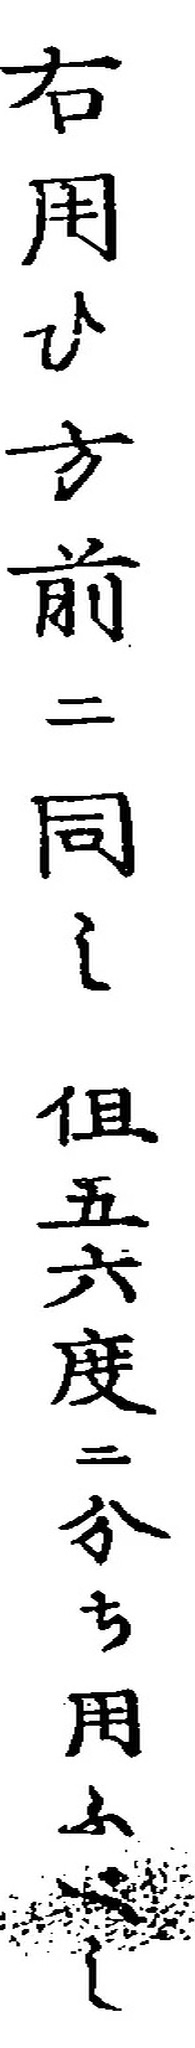右用ひ方前に同し且五六度に分ち用ふべし
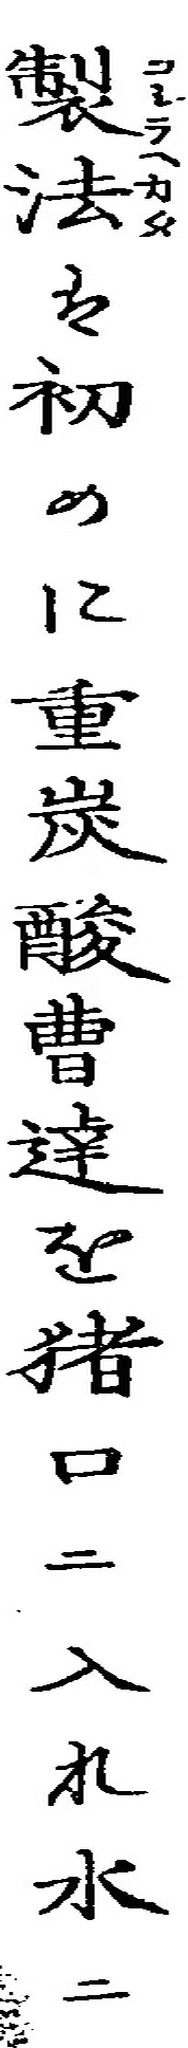製法は初めに重炭酸曹達を猪口に入れ水に

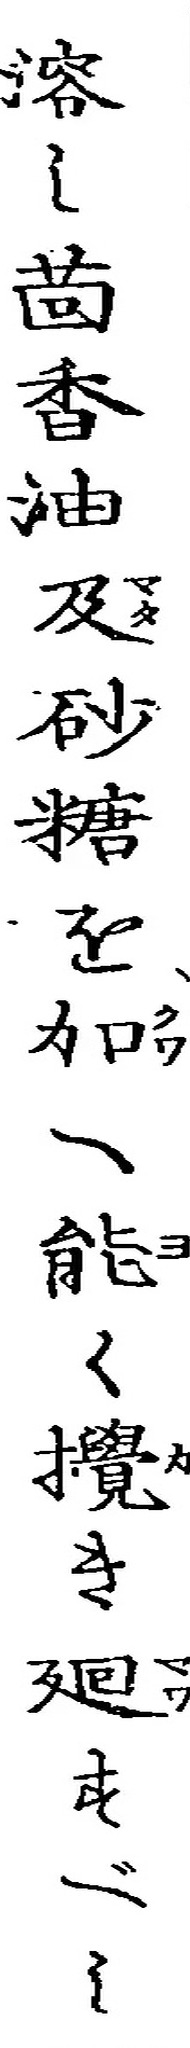溶し茴香油及砂糖を加へ能く攪き廻すべし
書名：伝染病予防法
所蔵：国立国会図書館 National Diet Library, JAPAN
